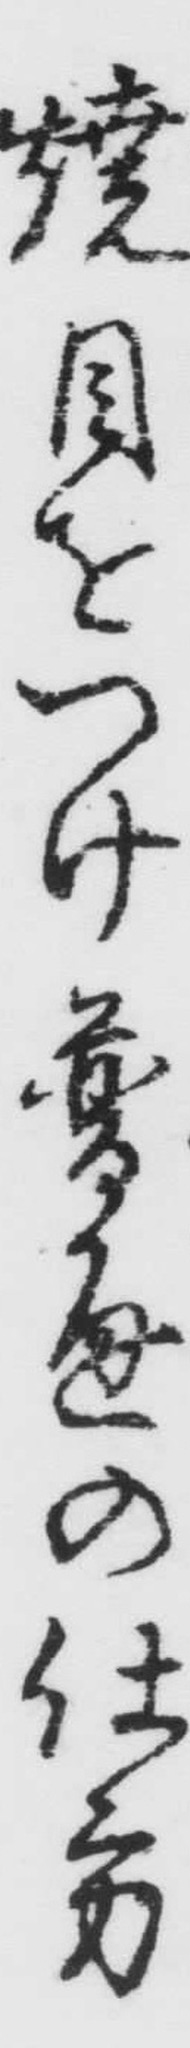焼目をつけ普通の仕方
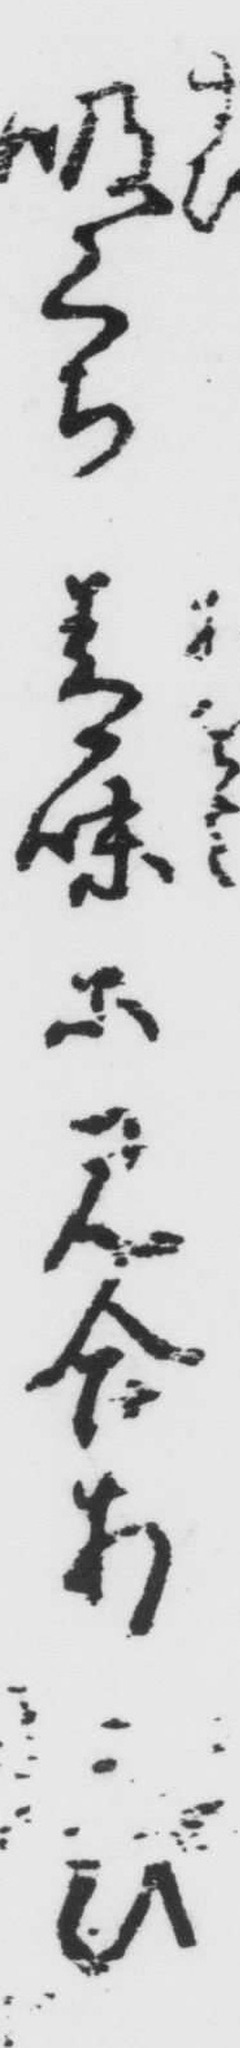吸くち青味に見合あひ
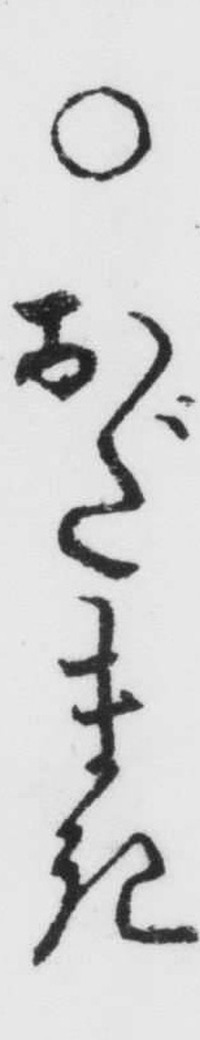○おだまき
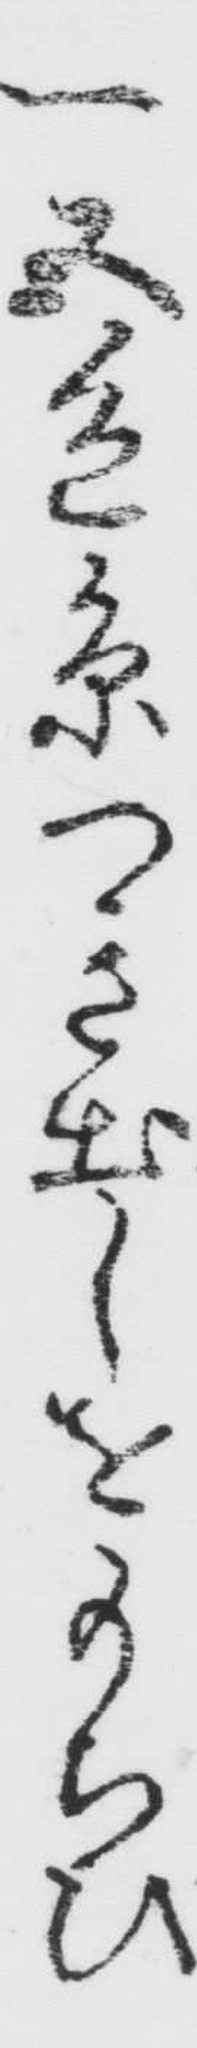一五色糸つき出しをもちひ
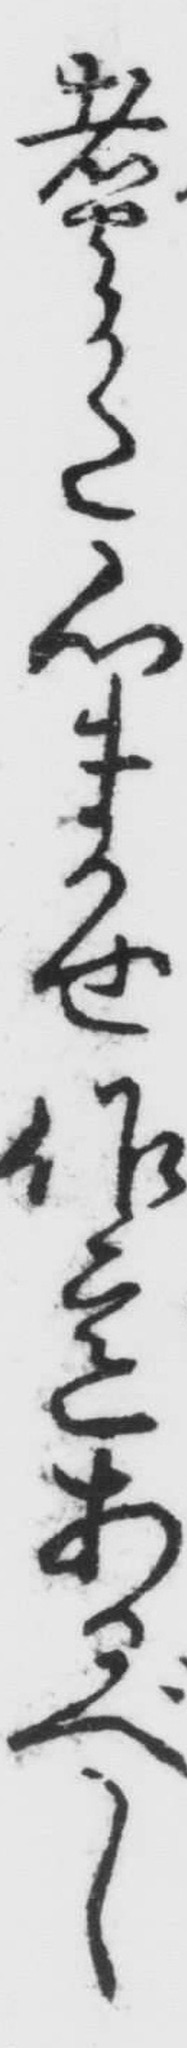煮かた心まかせ作意あるべし
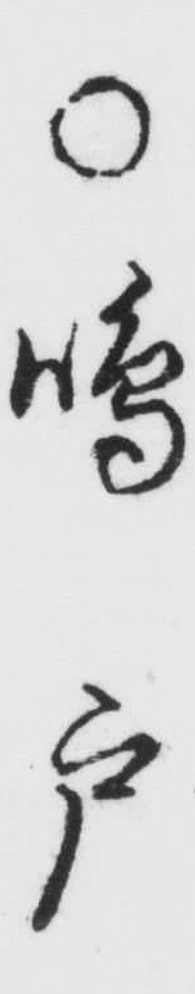○鳴門
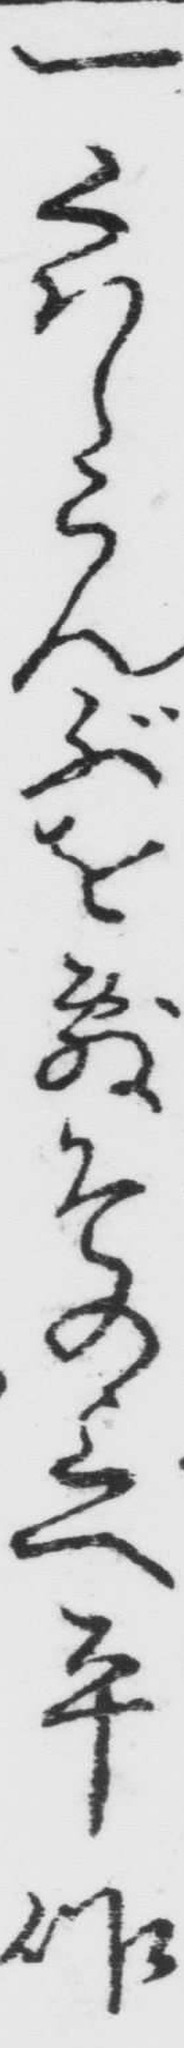一くはしこんぶを敷その上へ平作
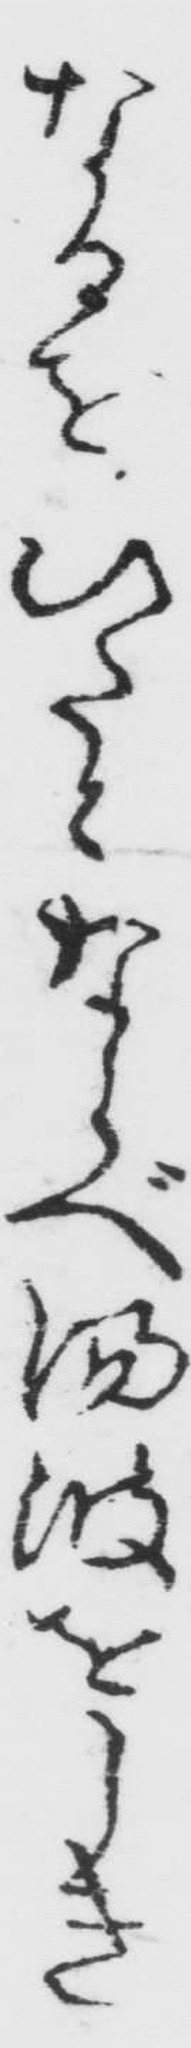なるをひたとならべ湯波をしき
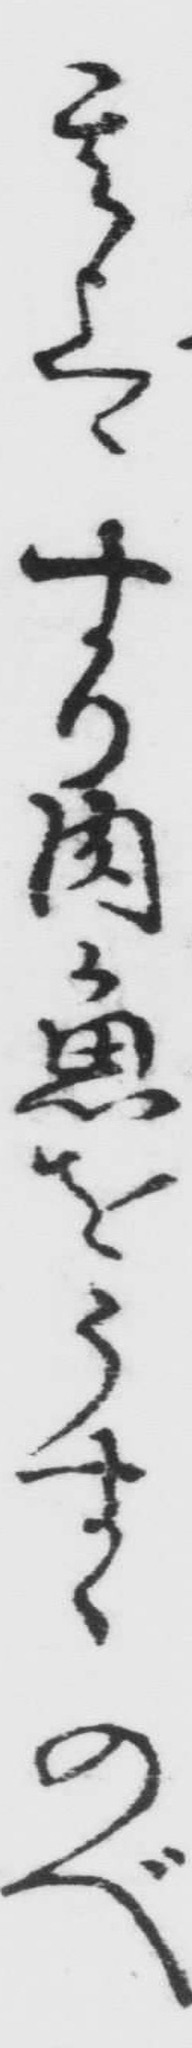其上へすり肉魚をうすくのべ

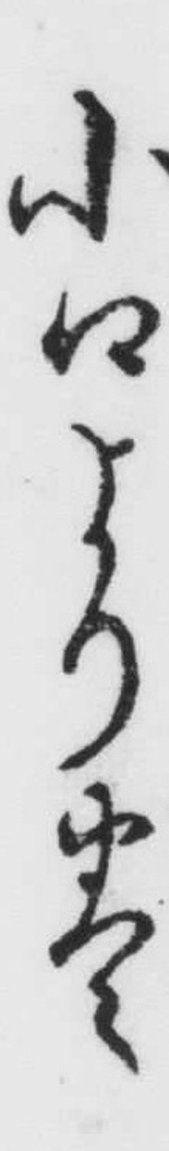小口より巻
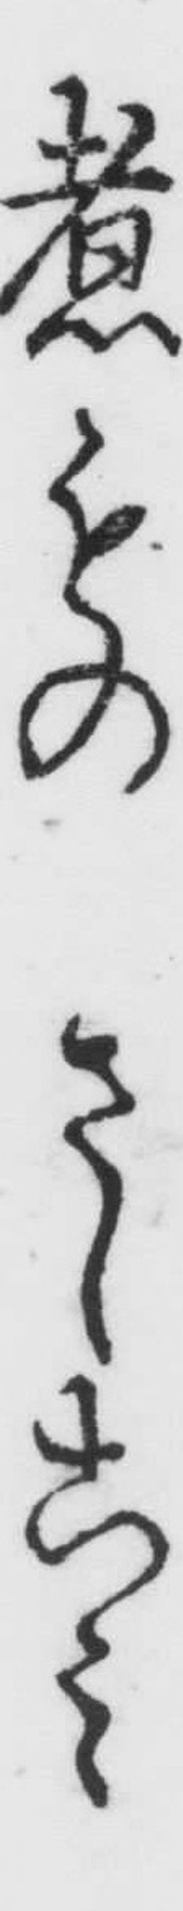煮ものさしこみ
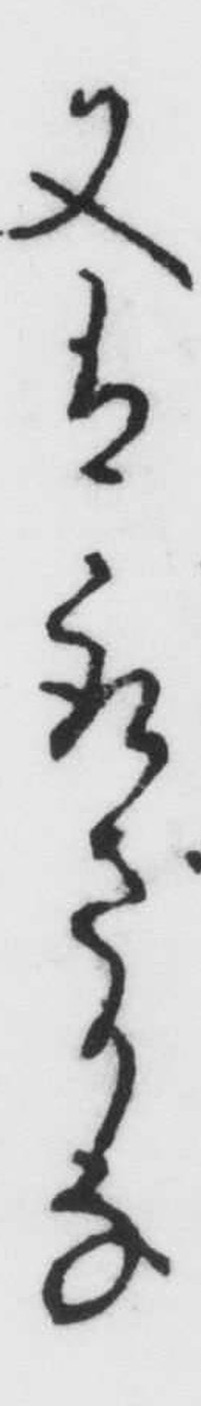又は取ざかな
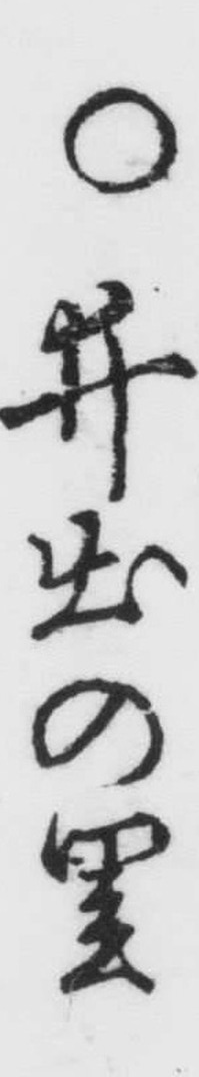○井戸の里
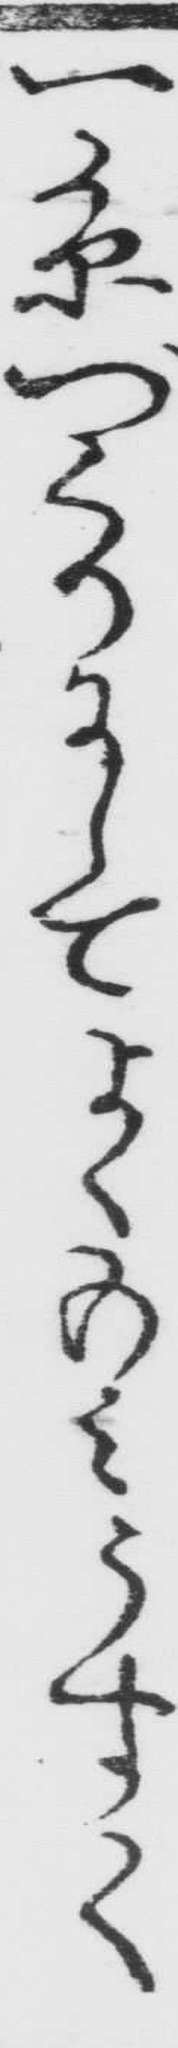一糸づくりにしてよくもみうすく
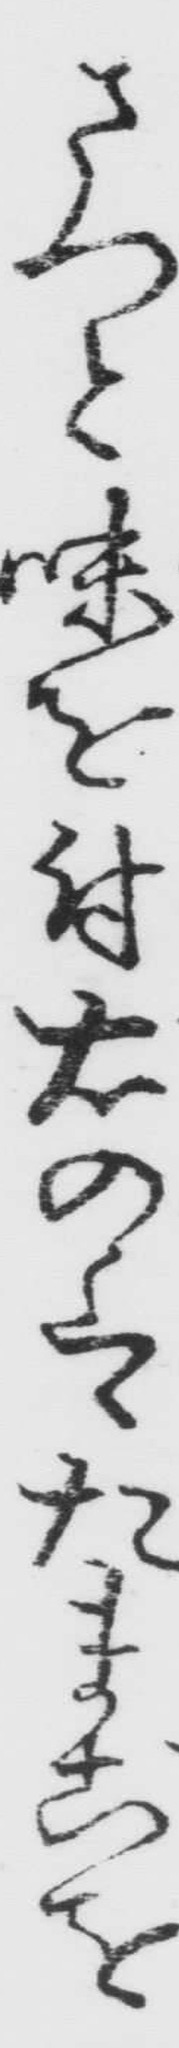ざつと味を付右の上へたまごを
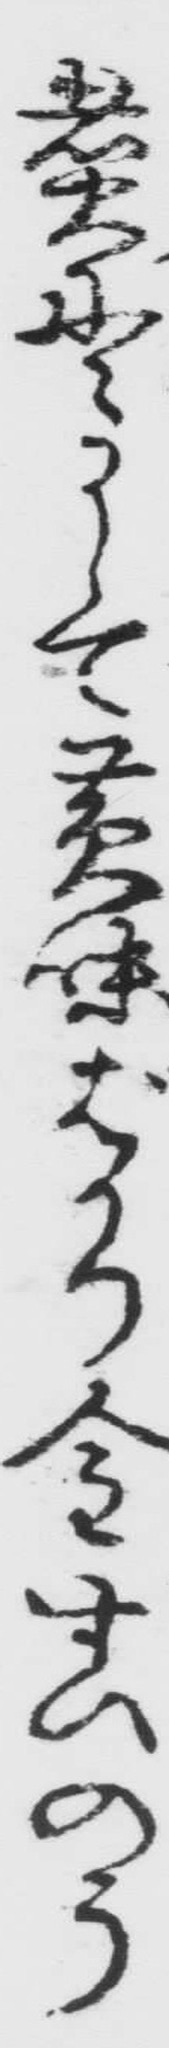煮貫にして黄味ばかり金ずいのう
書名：蒟蒻百珍
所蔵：大阪府立大学学術情報センター 国文学研究資料館
